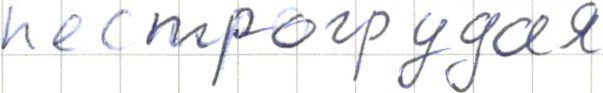пестрогрудая
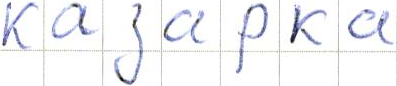казарка
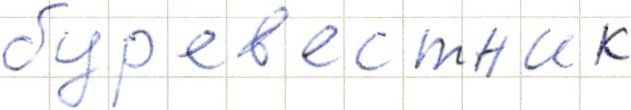буревестник
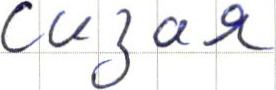сизая
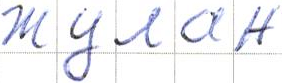жулан
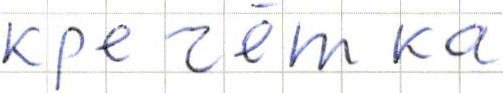кречётка
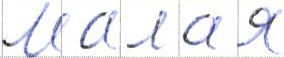малая
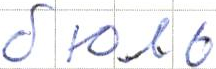бюль
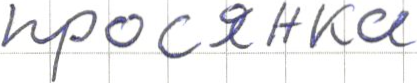просянка
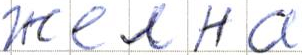желна
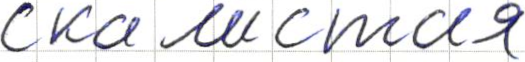скалистая
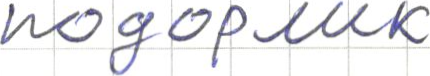подорлик
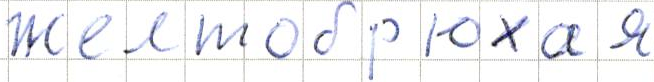желтобрюхая
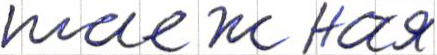таежная
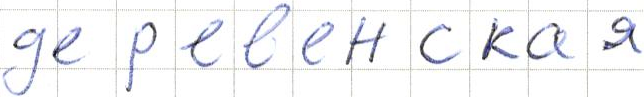деревенская
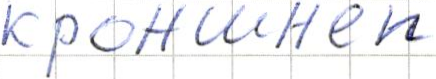кроншнеп
